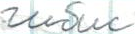чибис
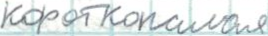короткопалая
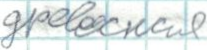древесная
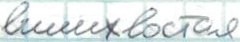вилихвостая
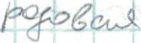розовая
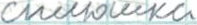сплюшка
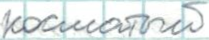косматый
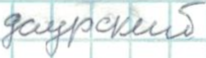даурский
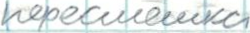пересмешка
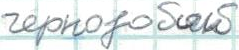чернозобый
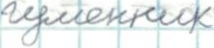гуменник
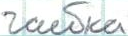чайка
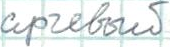арчевый
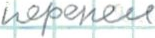перепел
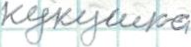кукушка
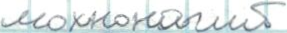мохноногий
